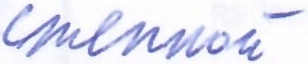степной
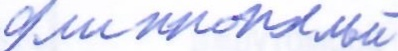длиннопалый
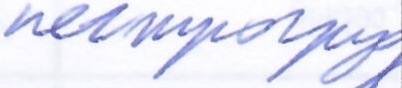пестрогруд
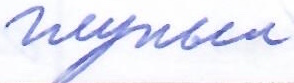глупыл
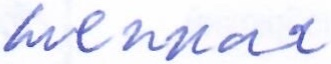тепная
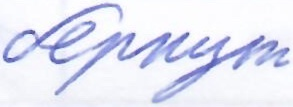беркут
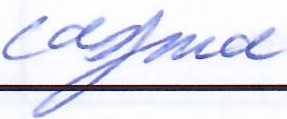саджа
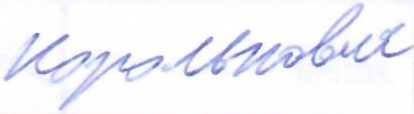корольковля
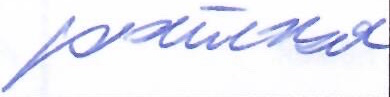райская
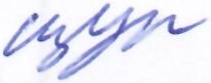щур
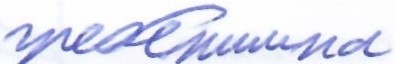гребенишка
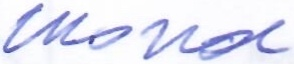скопа
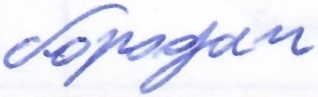бородач
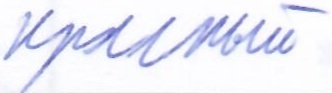красный
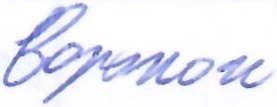воронок
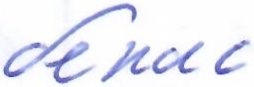бепас
